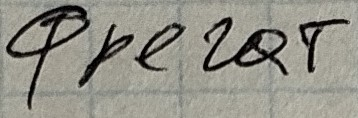фрегат
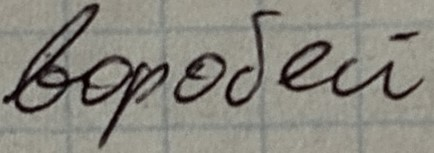воробей
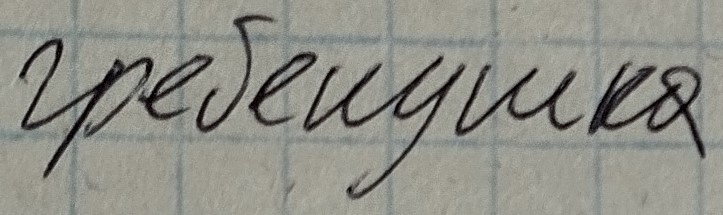гребенушка
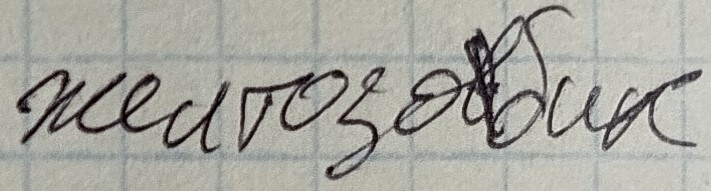желтозовбик
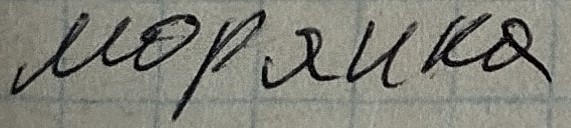морянка
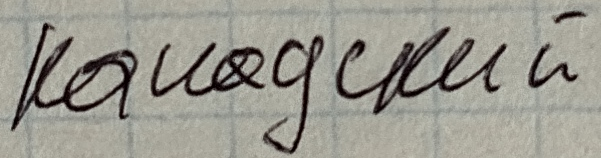канадский
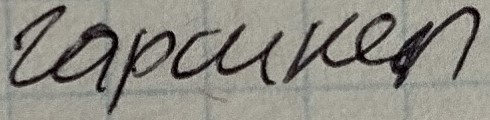гаршнеп
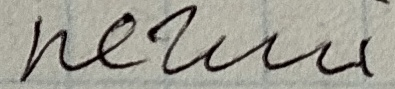пегий
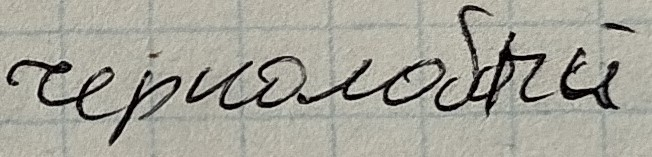чернолобый
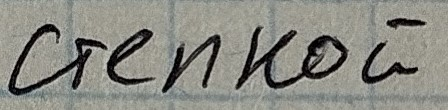степной
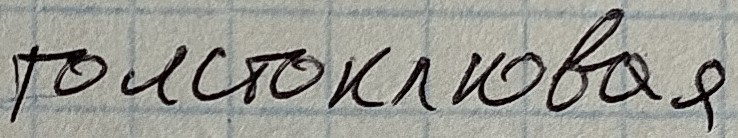толстоклювая
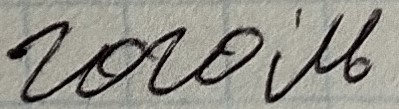гоголь
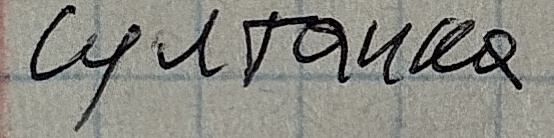султанка
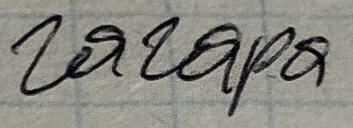гагара
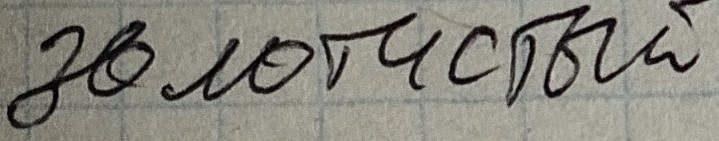золотистый
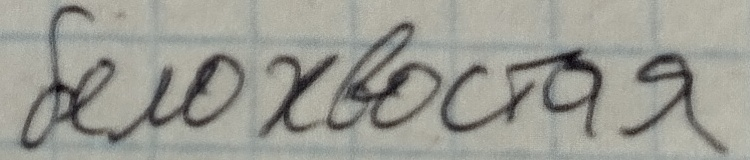белохвостая
